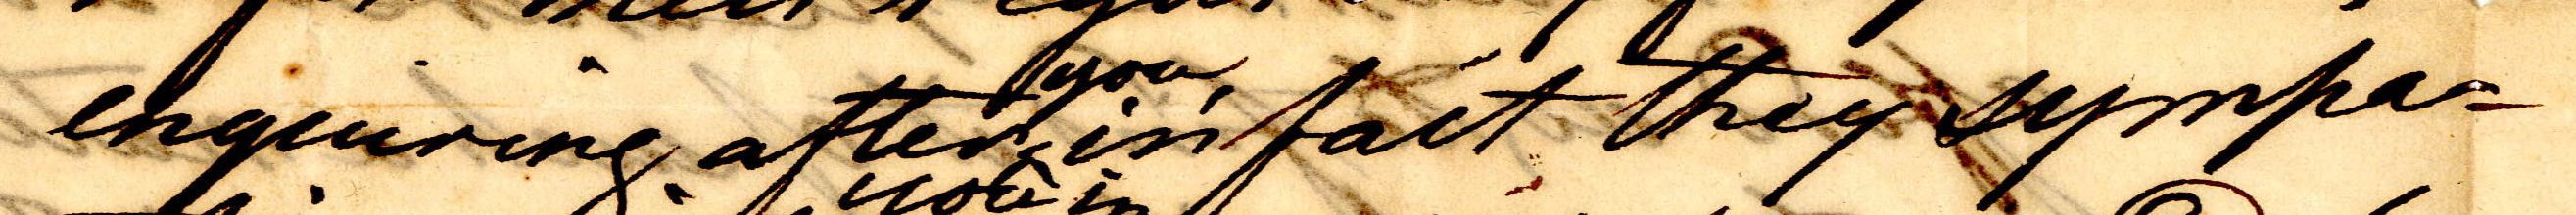enquiring after ^ in fact they sympa-
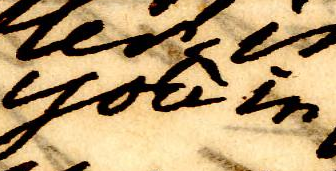you in
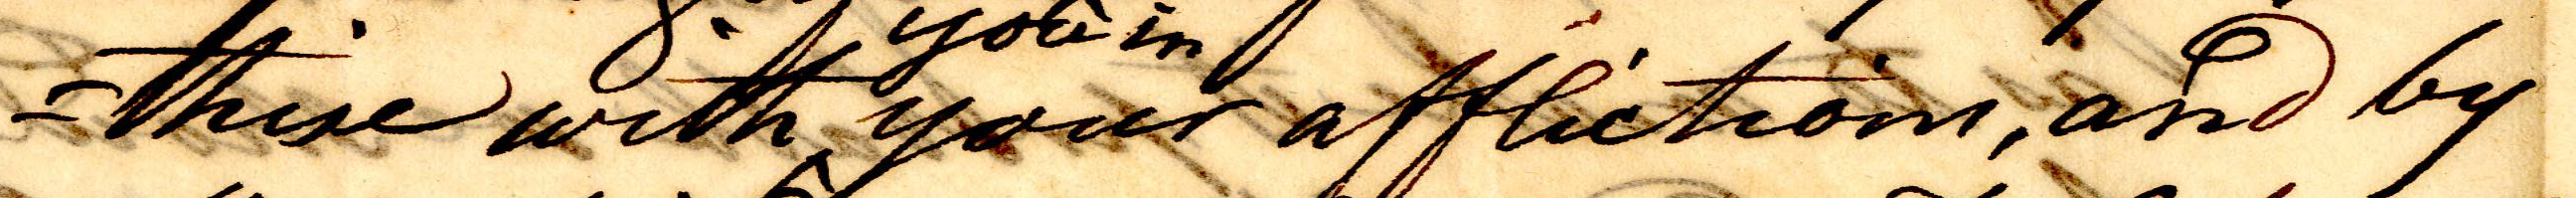-thise with ^ your afflictions, and by
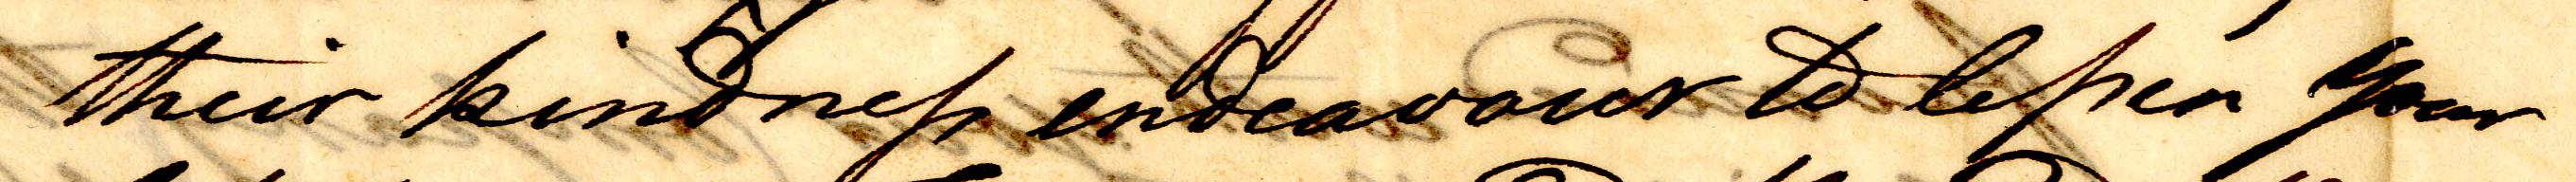their kindness endeavour to lessen your
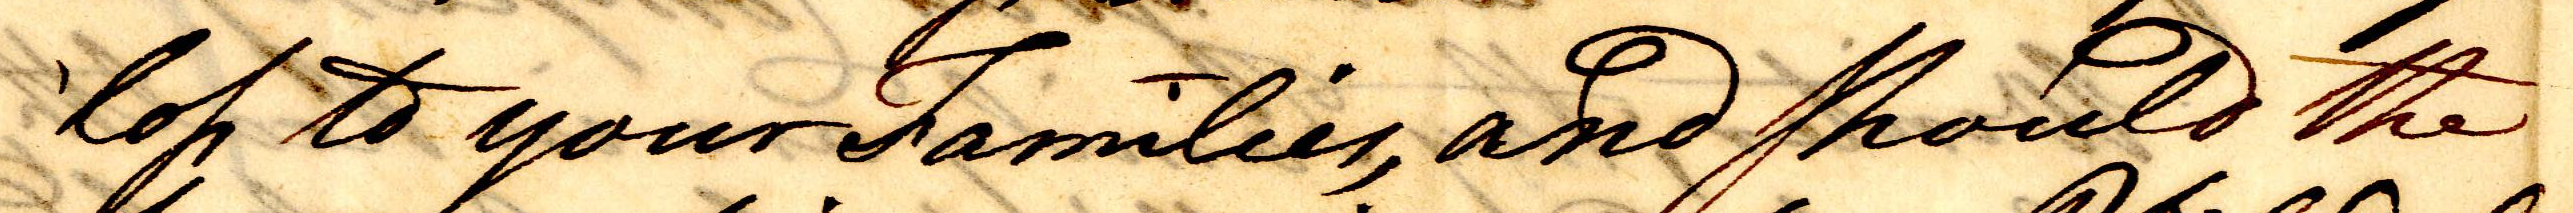loss to your Families, and should the
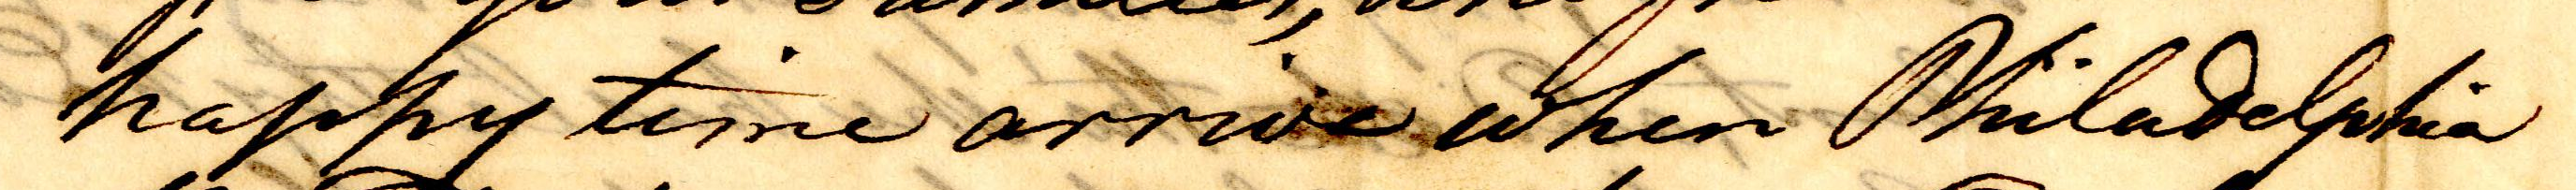happy time arrive when Philadelphia
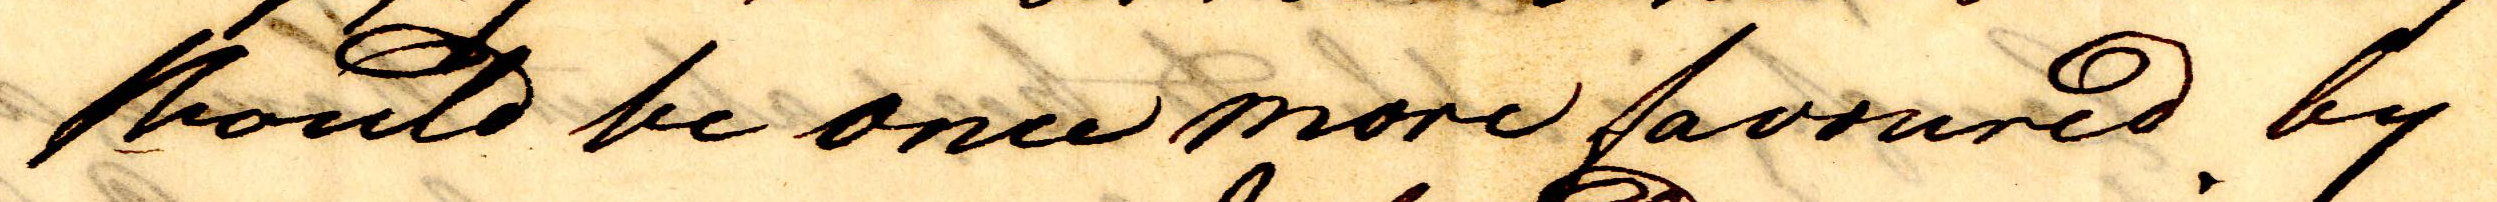should be once more favoured by
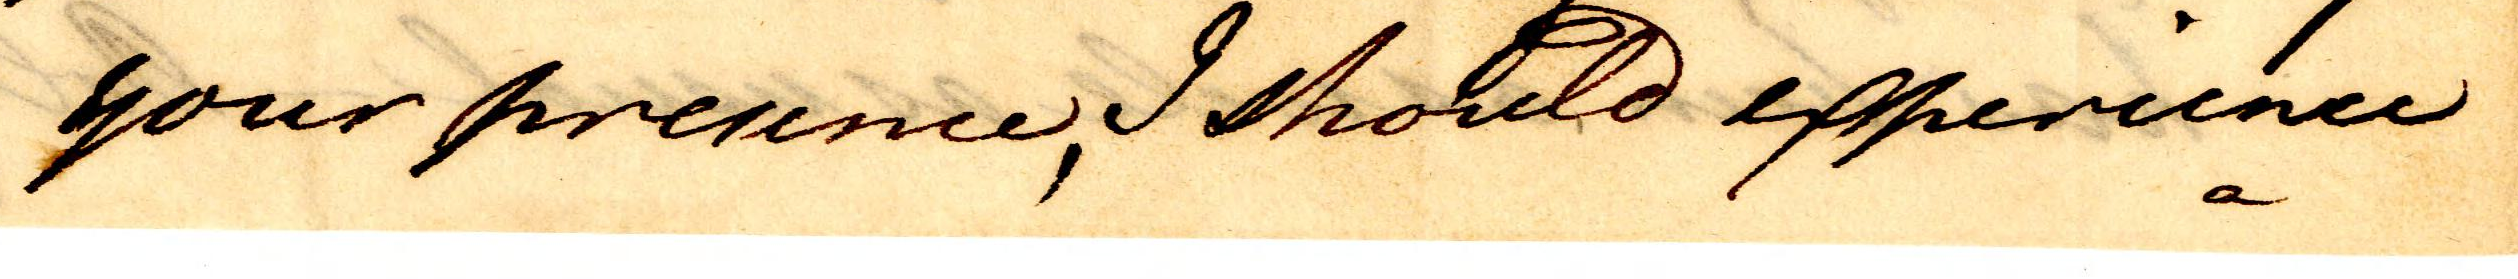your presence, I should experience
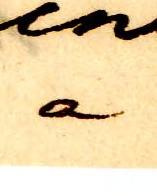a
